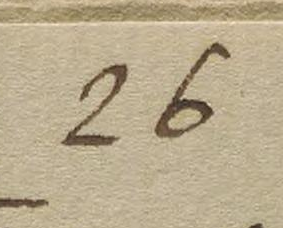26
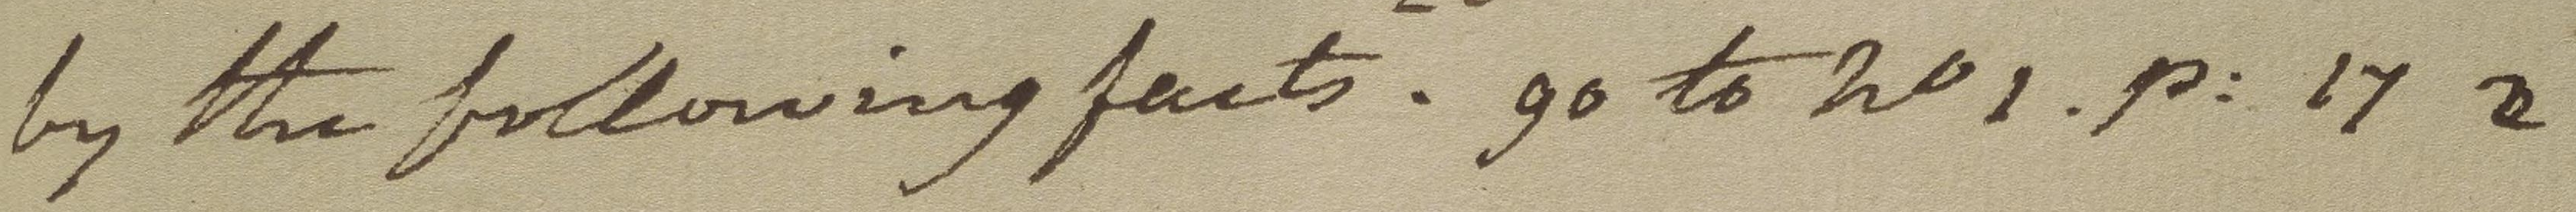by the following facts. go to N^o 1. p: 17 2
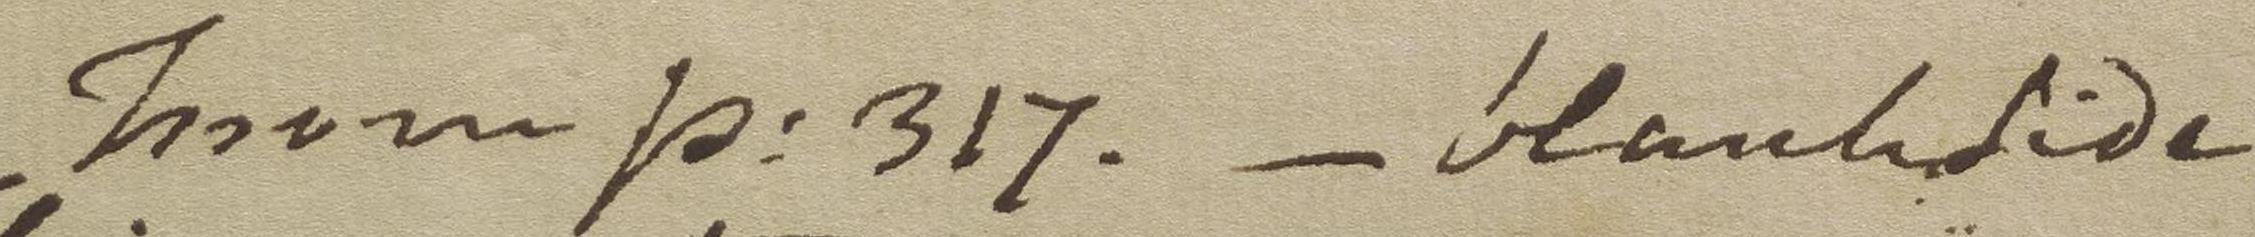From p: 317. blanchside
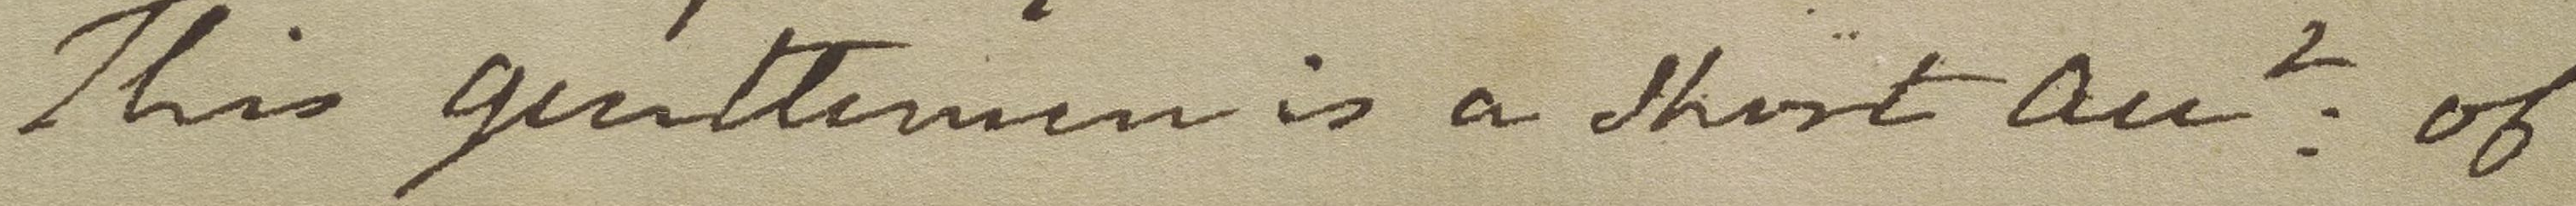This gentlemen is a short acc^t: of
